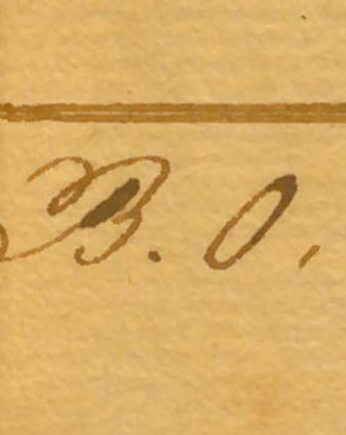B. O.
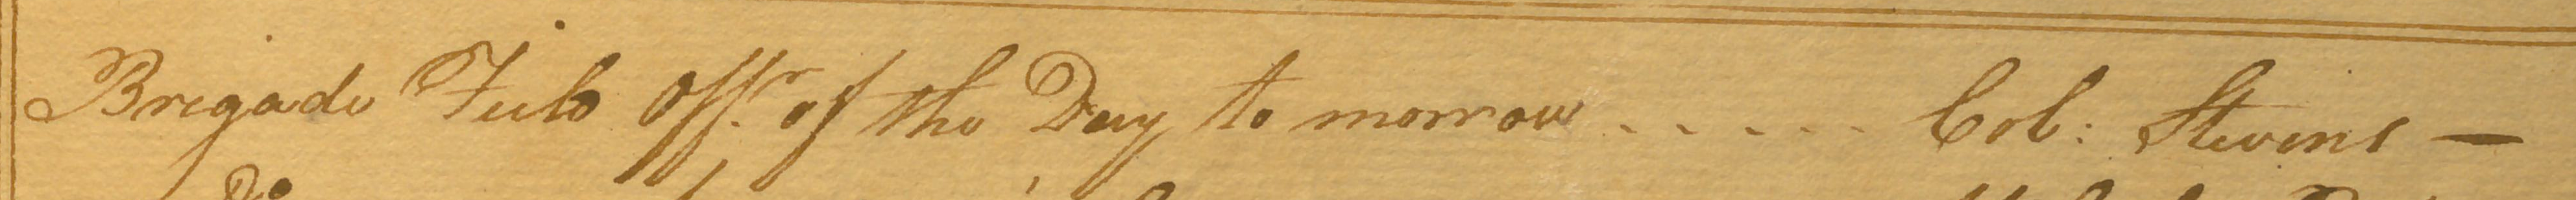Brigade Field Off^r. of the Day to morrow ..... Col: Stevens-
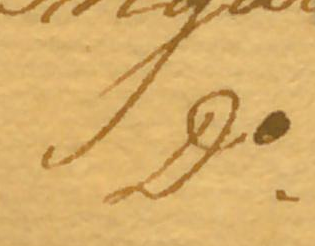D^o
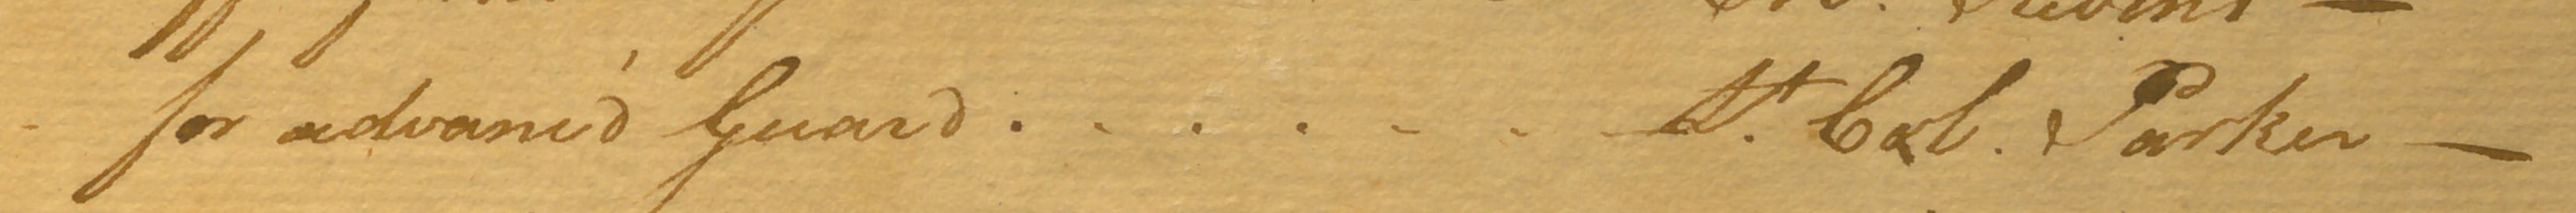for advanc'd Guard....... S^t. Col. Parker-
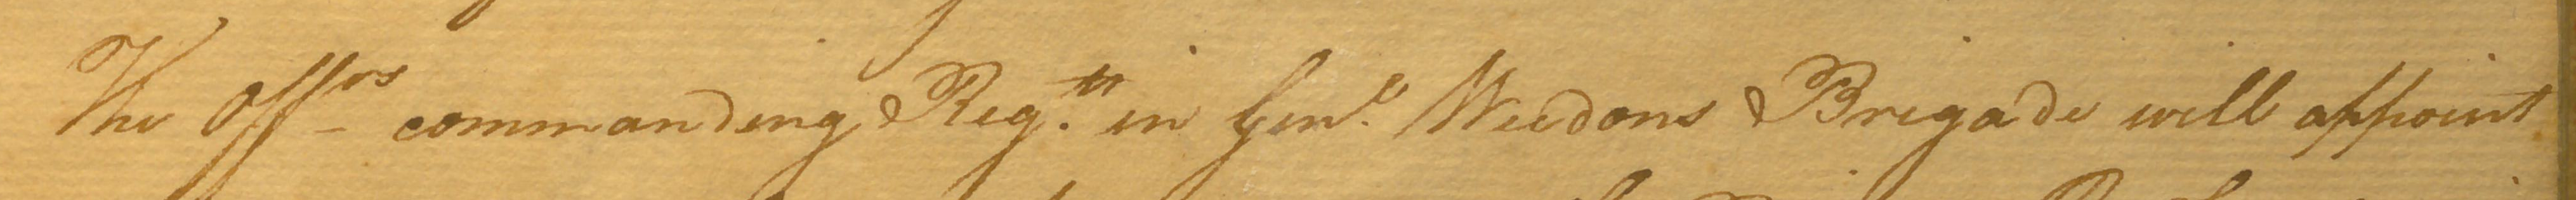The Off^rs. commanding Reg^ts. in Gen^l. Weedons Brigade will appoint
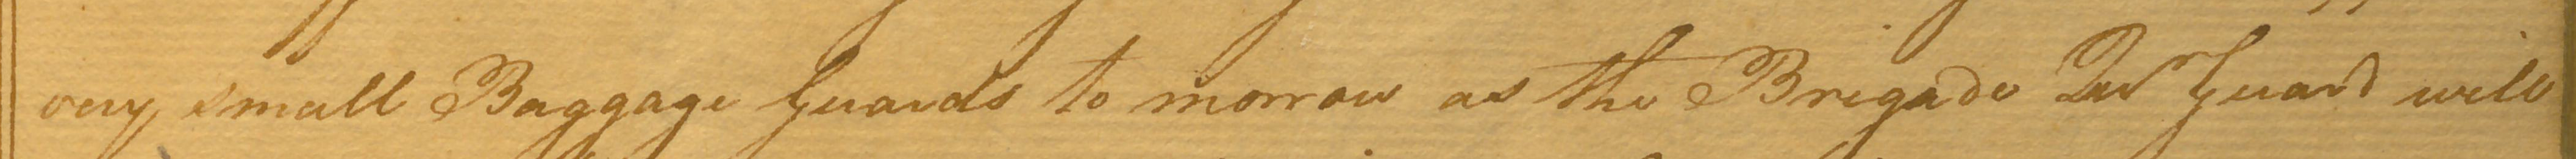very small Baggage Guards to morrow as the Brigage Qu^r Guard will
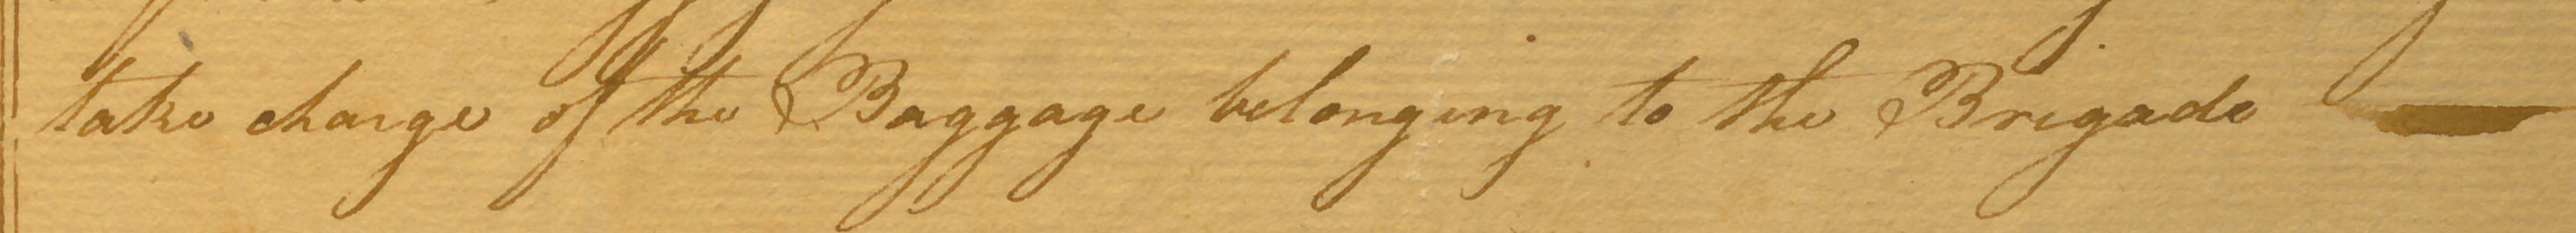take charge of the Baggage belonging to the Brigade
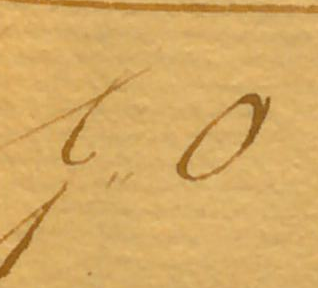G. O
